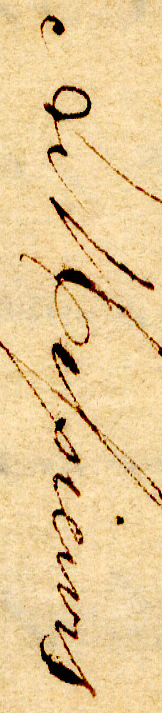à Messieurs
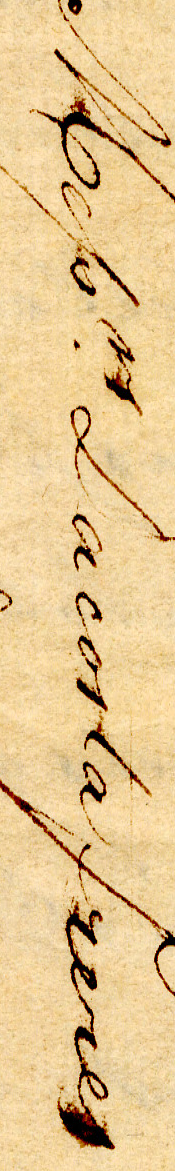Mess^rs. Dacosta freres
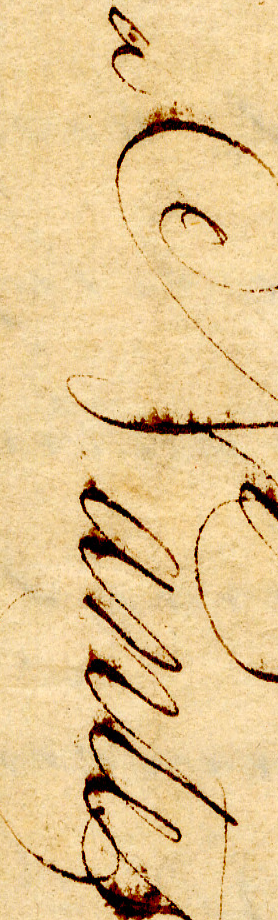a Nantes
